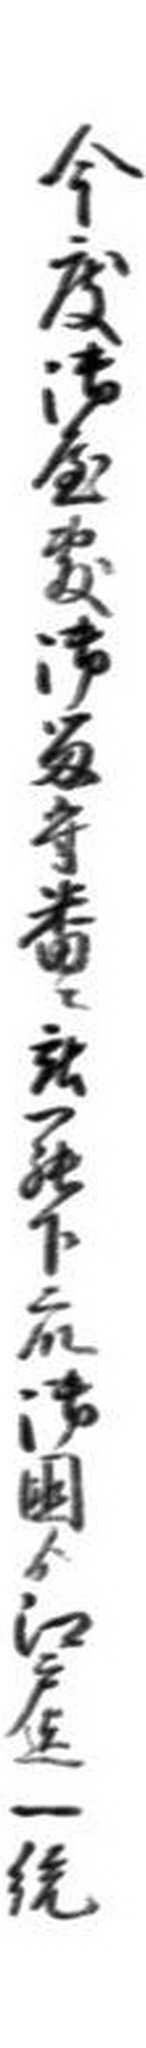今度御屋敷御留守番ニ被罷下衆御国ゟ江戸迄一統
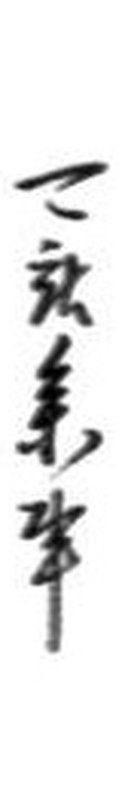可被参事
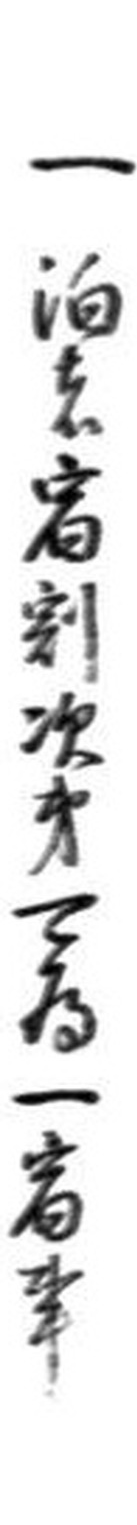一泊者宿割次第可為一宿事
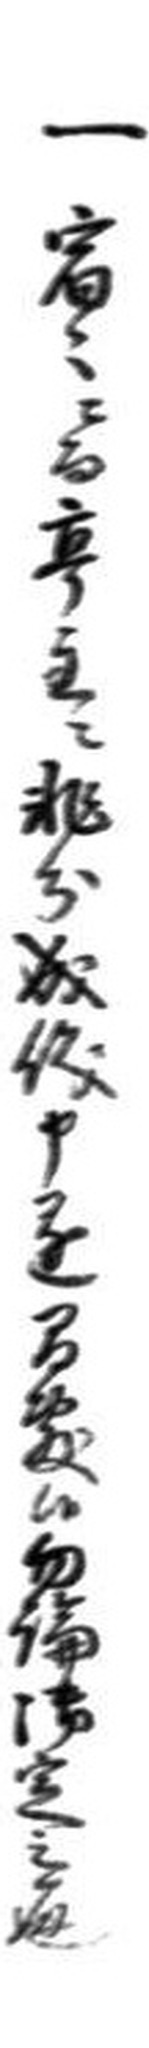一宿々ニ而亭主ニ非分成儀申懸間敷候勿論御定之通

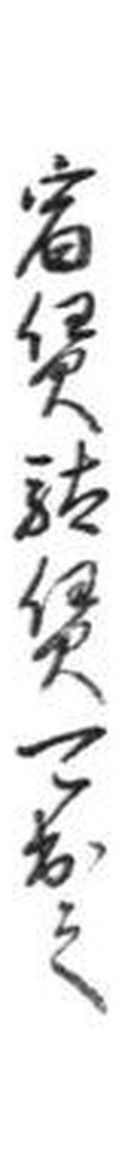宿賃駄賃可出之
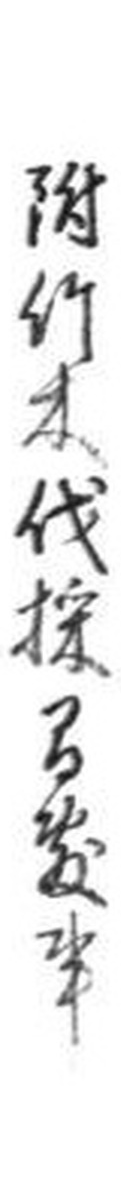附竹木伐採間敷事
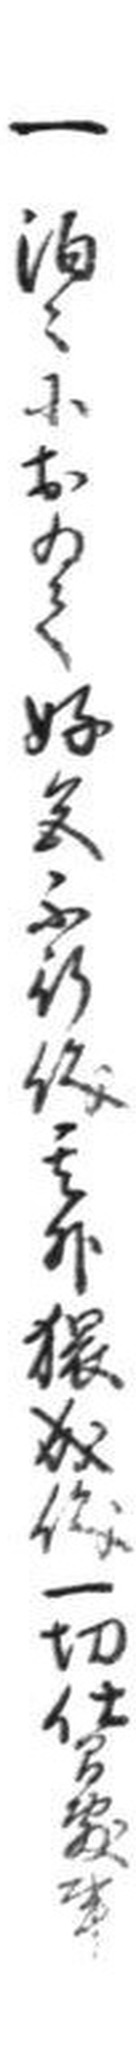一泊々におゐて好色不行儀其外猥成儀一切仕間敷事
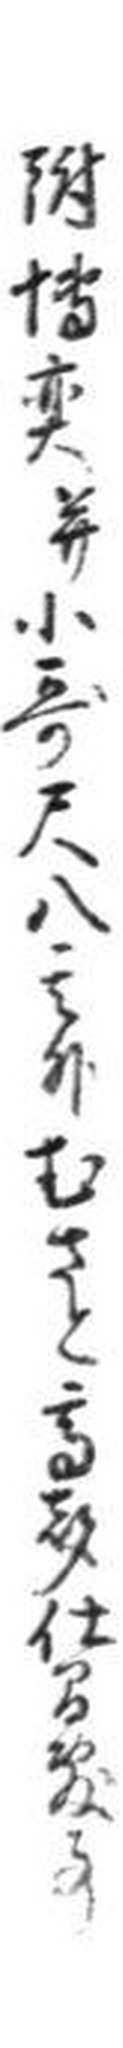附博奕幷小歌尺八其外むさと高声仕間敷事
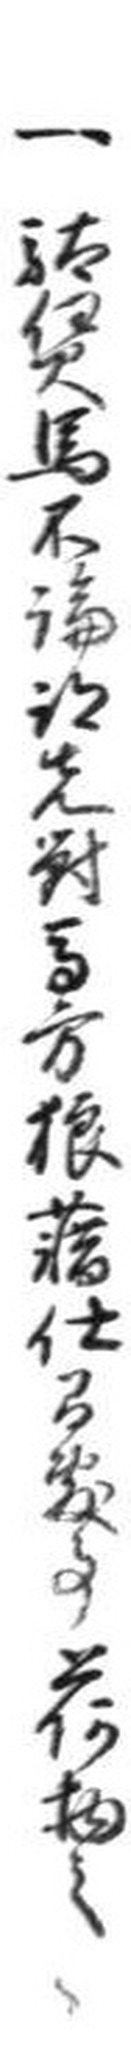一駄賃馬不論跡先対馬方狼藉仕間敷事荷物之
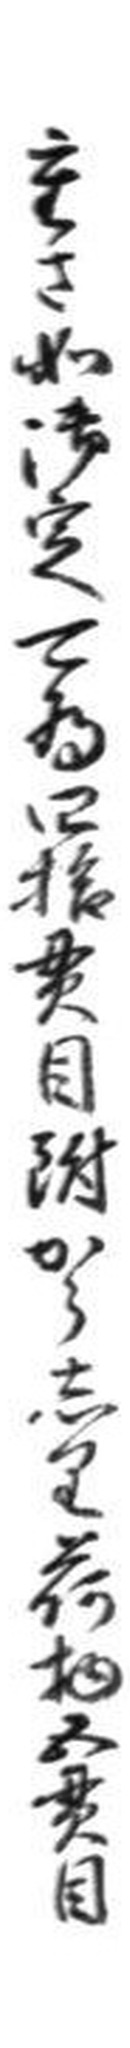重さ如御定可為四拾貫目附からしり荷物五貫目
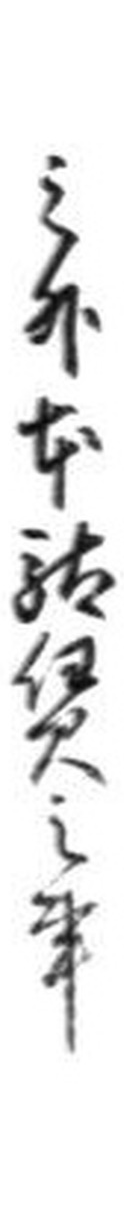之外本駄賃之事
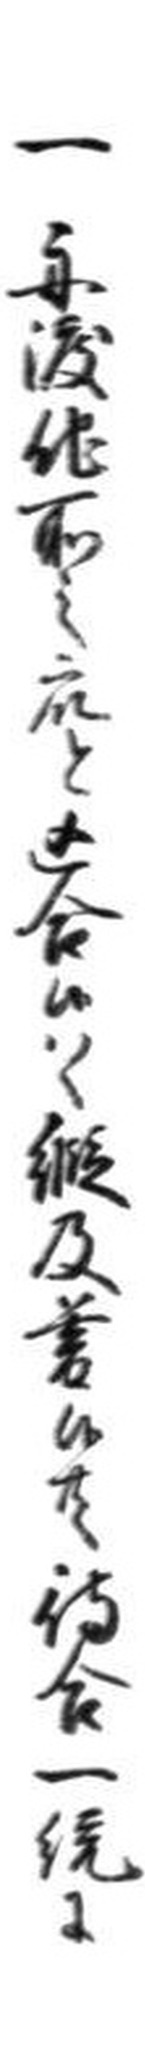一舟渡他所之衆と込合候ハヽ縦及暮候共待合一統に
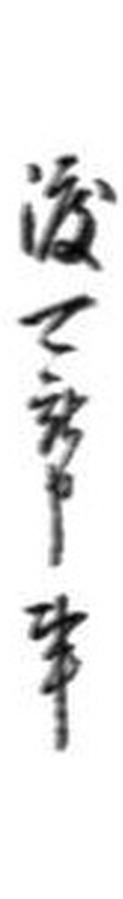渡可被申事
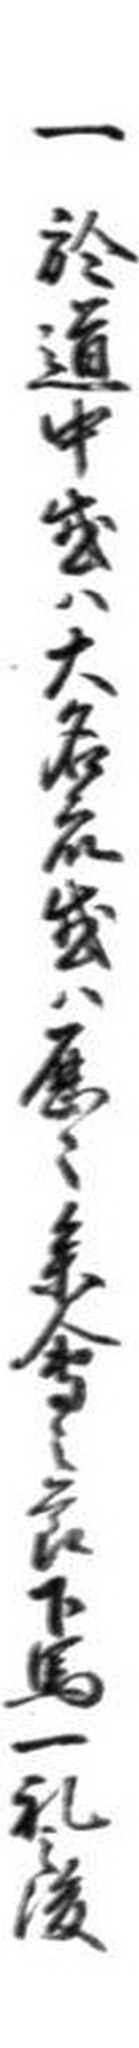一於道中或ハ大名衆或ハ歴々参会之節下馬一礼之後
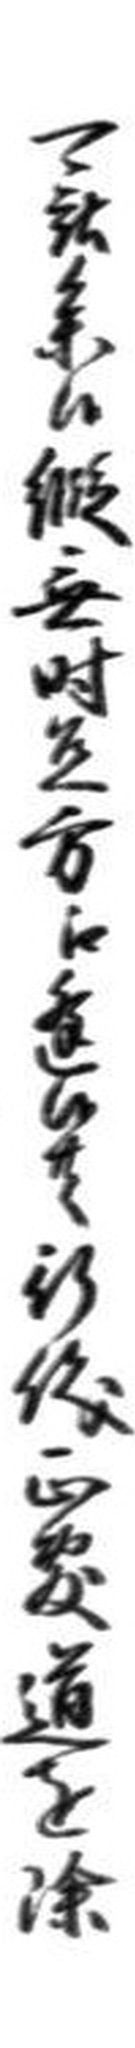可被参候縦無時宜方江逢候共行儀正敷道を除
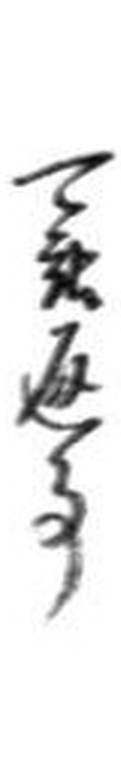可被通事
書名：家譜 七 光通公 従寛文四年到同九年
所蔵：福井県文書館 Fukui Prefectural Archives
